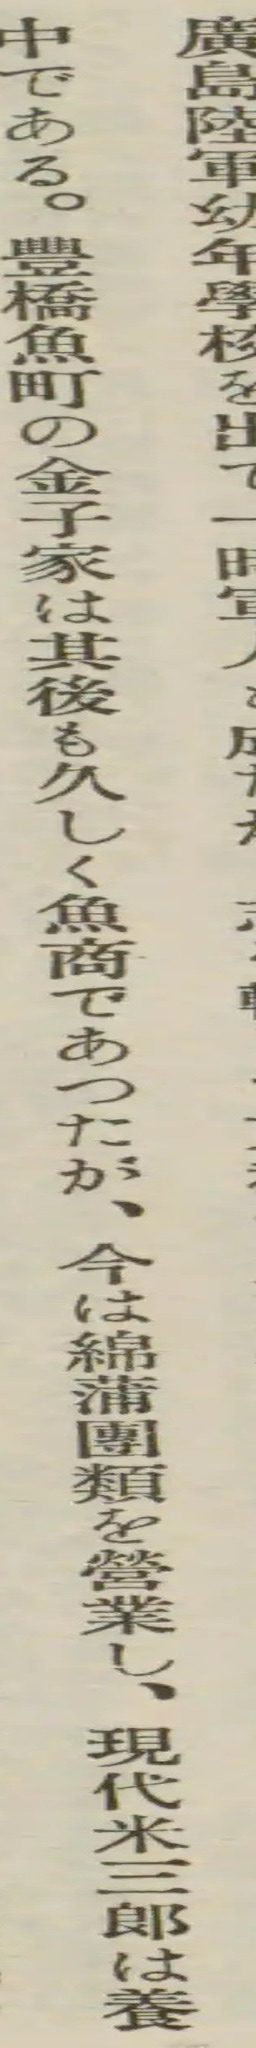中である。豊橋魚町の金子家は其後も久しく魚商であつたが、今は綿蒲団類を営業し、現代米三郎は養
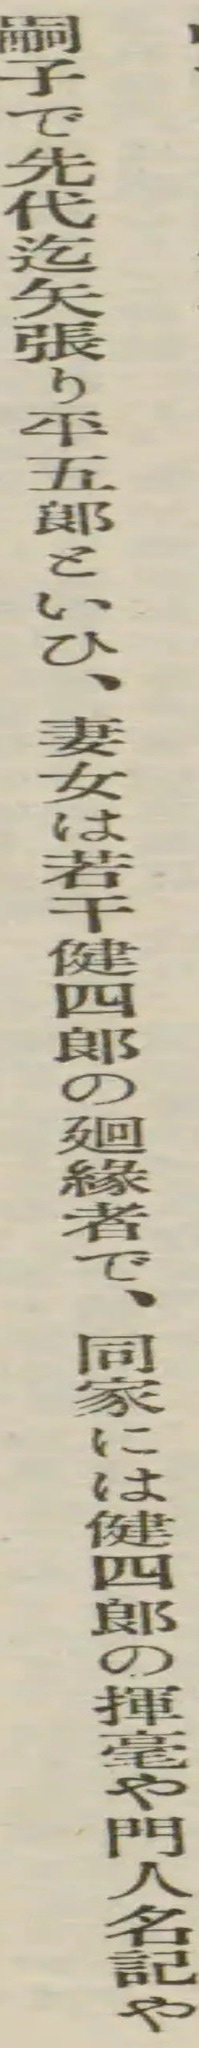嗣子で先代迄矢張り平五郎といひ、妻女は若干健四郎の廻縁者で、同家には健四郎の揮毫や門人名記や
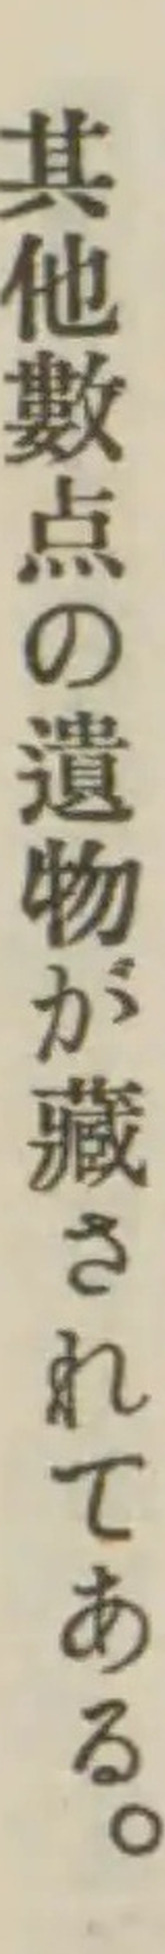其他数点の遺物が蔵されてある。

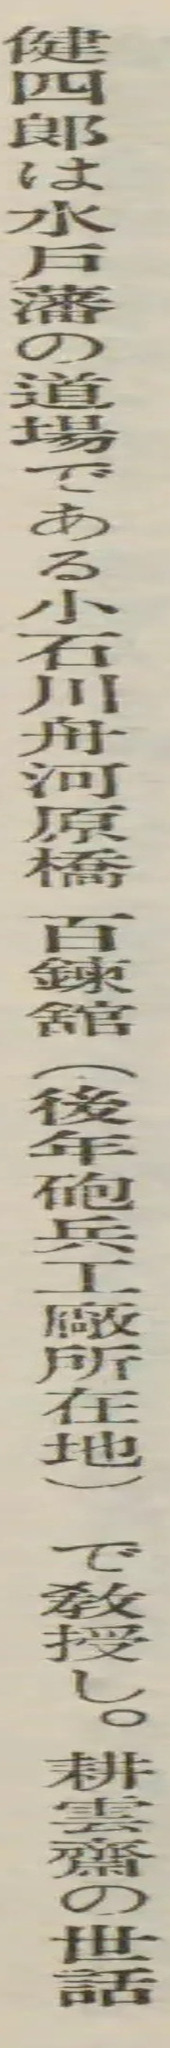健四郎は水戸藩の道場である小石川舟河原橋百錬館(後年砲兵工廠所在地)で教授し。耕雲齋の世話
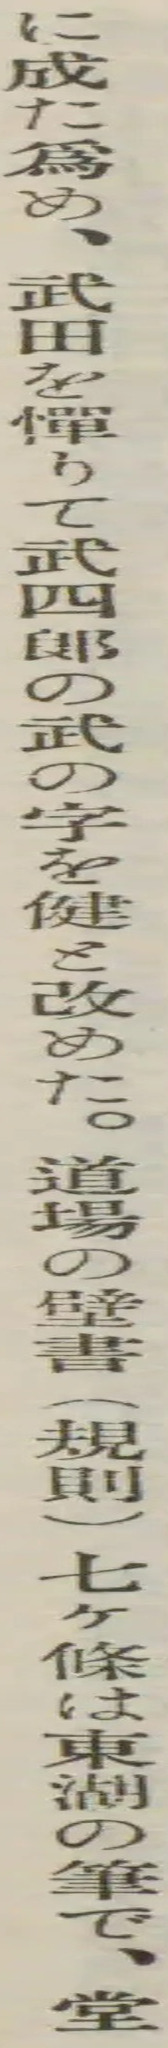に成た為め、武田を憚りて武四郎の武の字を健と改めた。道場の壁書(規則)七ヶ条は東湖の筆で、堂
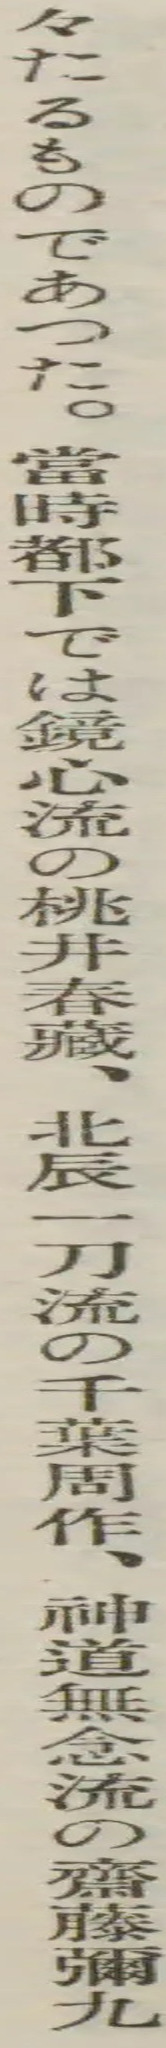々たるものであつた。当時都下では鏡心流の桃井春蔵、北辰一刀流の千葉周作、神道無念流の斎藤彌九
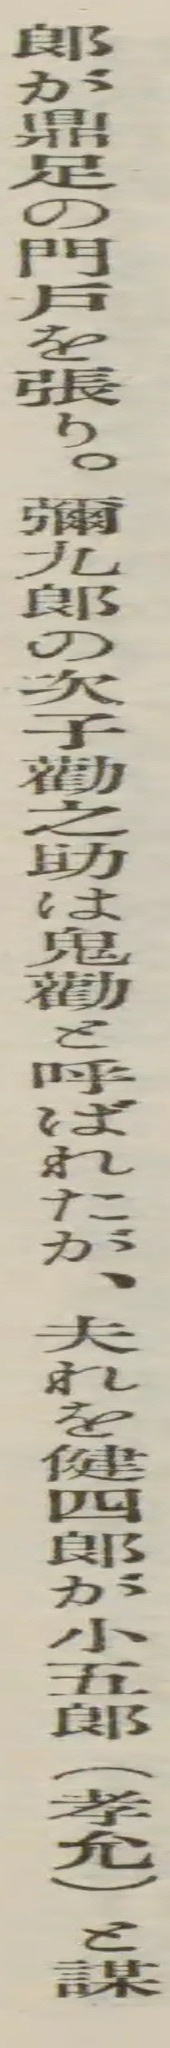郎が鼎足の門戸を張り。彌九郎の次子勤之助は鬼勤と呼ばれたが、夫れを健四郎が小五郎(孝允)と謀
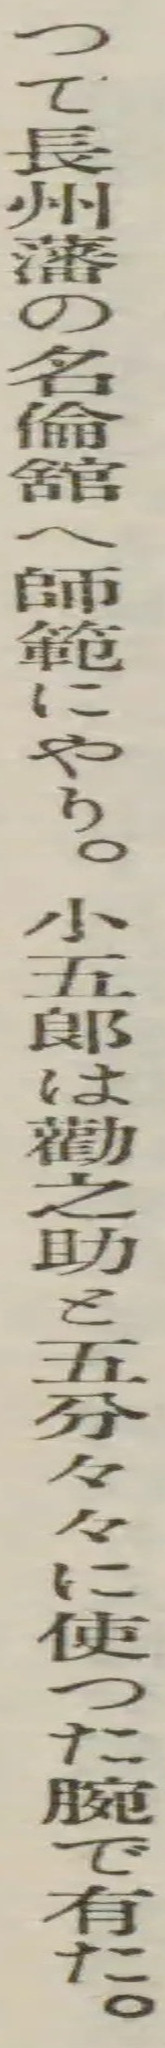つて長州藩の明倫館へ師範にやり。小五郎は勤之助と五分々々に使つた腕で有た。
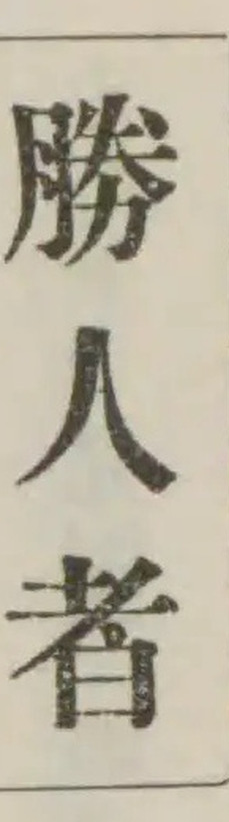勝人者
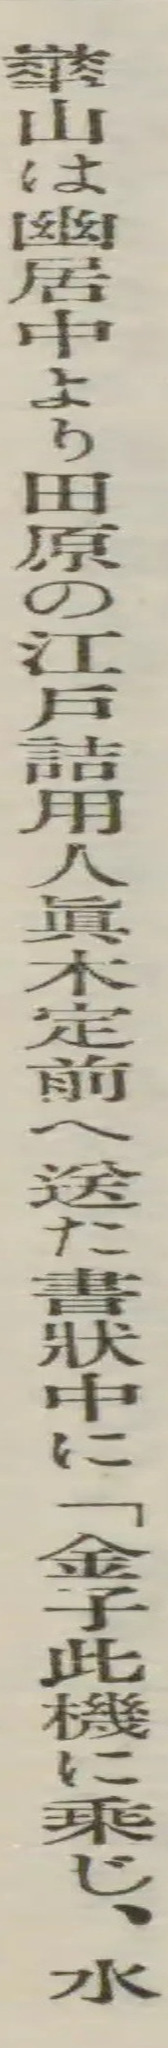蕐山が幽居中より田原の江戸詰用人眞木定前へ送た書状中に「金子此機に乗じ、水
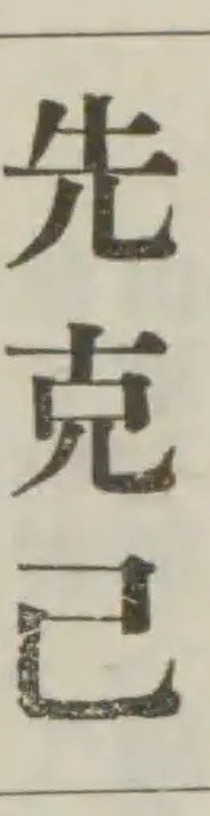先克己
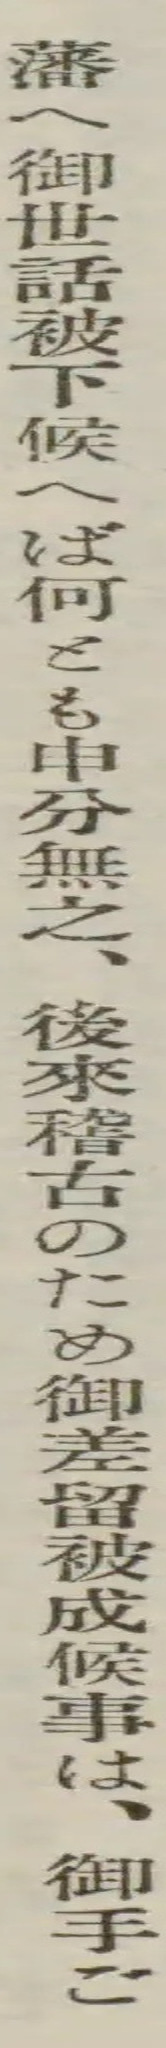藩へ御世話被下候へば何とも申分無之、後来稽古のため御差留被成候事は、御手ご
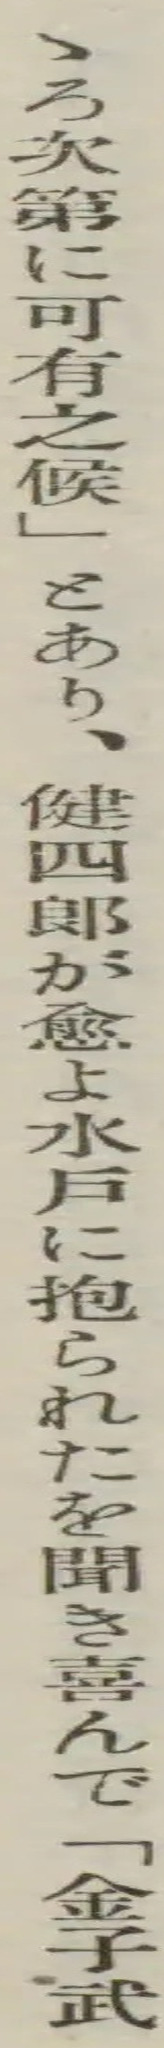ゝろ次第に可有之候」とあり、健四郎が愈よ水戸に抱られたを聞き喜んで「金子武
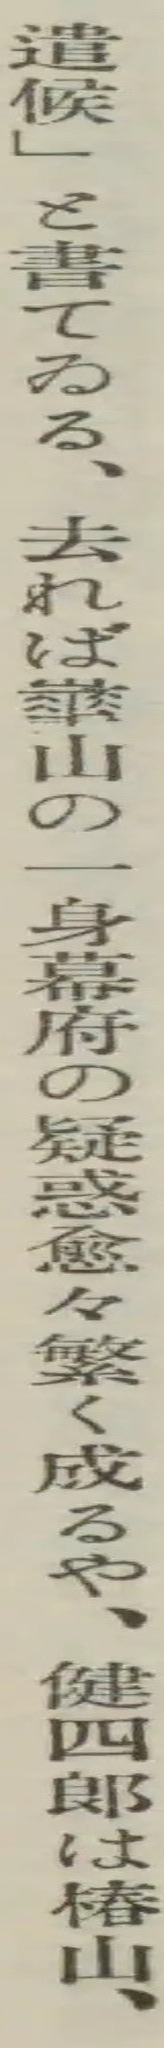遣候」と書てゐる、去れば蕐山の一身幕府の疑惑愈々繁く成るや、健四郎は椿山、
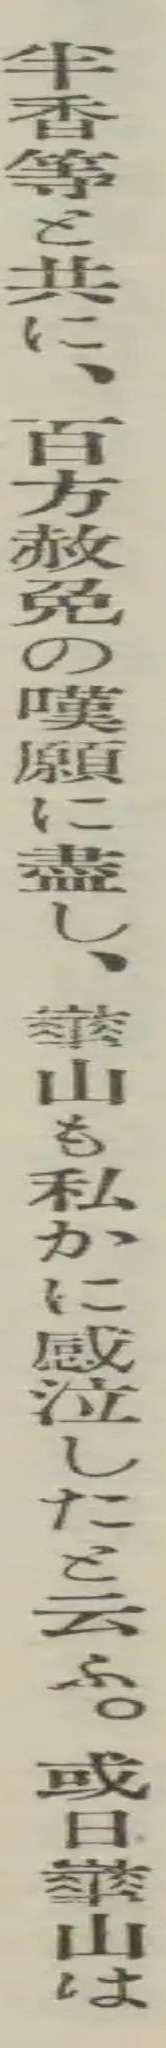半香等と共に、百方赦免の嘆願に尽し、蕐山も私かに感泣したと云ふ。或日蕐山は
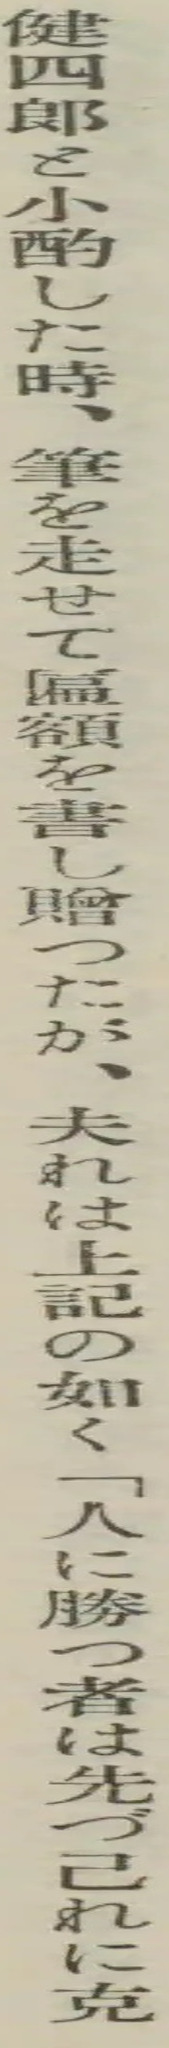健四郎と小酌した時、筆を走せて扁額を書し贈つたが、夫れは上記の如く「人に勝つ者は先づ己れに克
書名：小野湖山翁小伝
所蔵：国立国会図書館 National Diet Library, JAPAN
